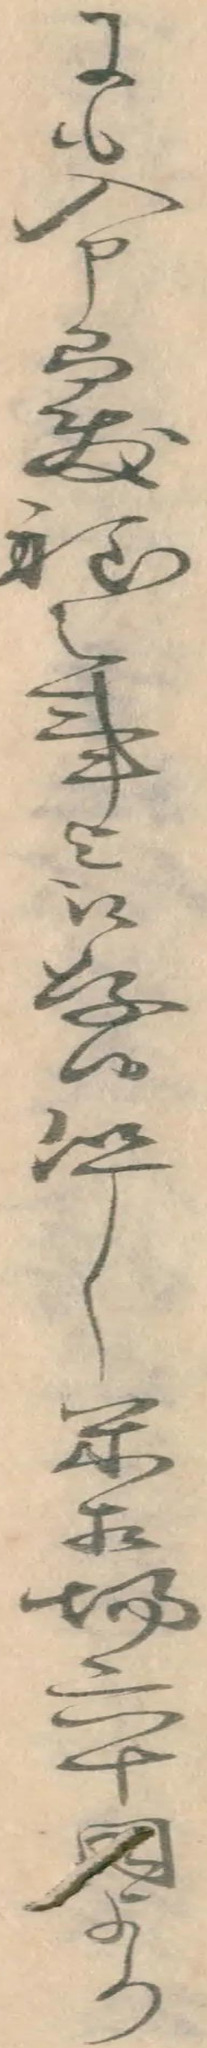にも入申間敷程之事と被存候但し米相場六十目より
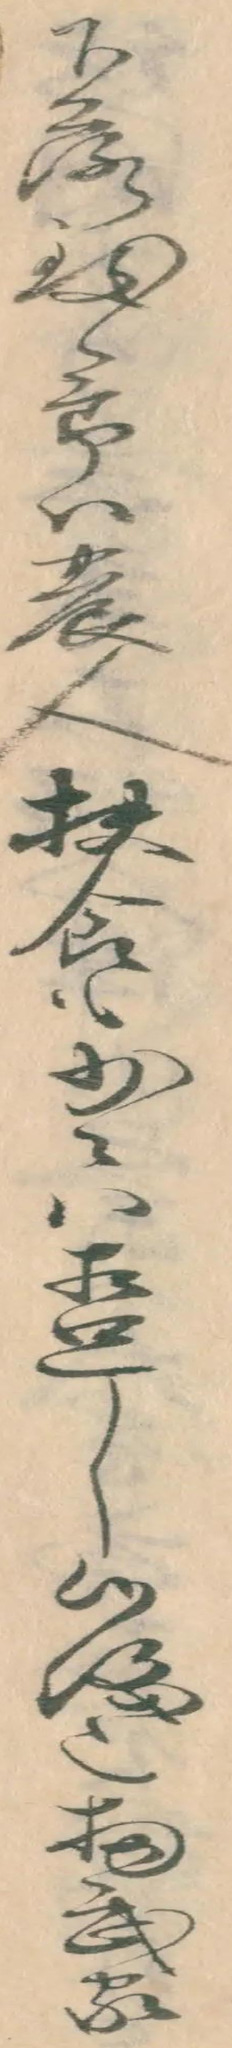下落致候節は農人扶食も少々は相廻し候儀也扨武家
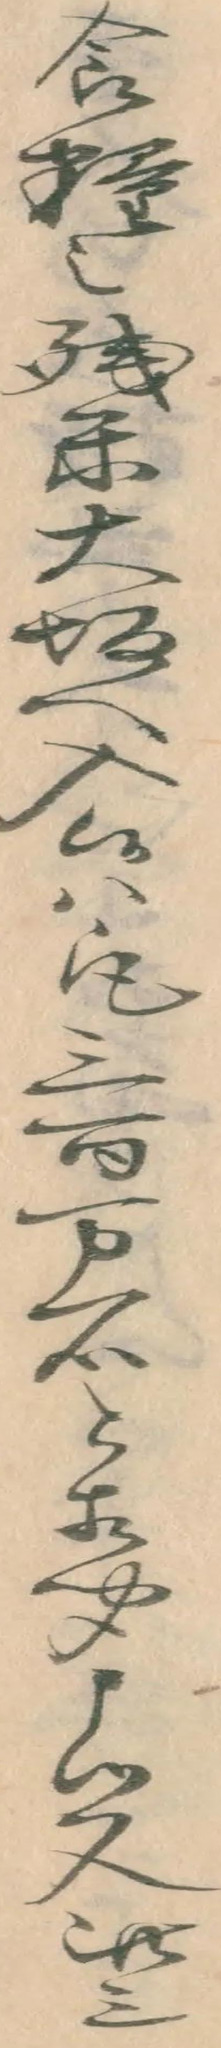食糧之残米大坂へ入候は凡三百万石と相聞申候又此三
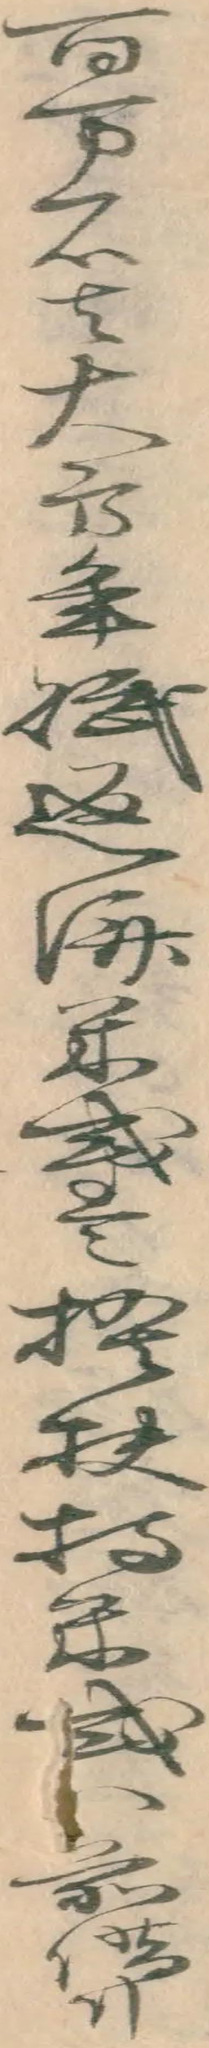百万石は大方年賦返済米或は捨扶持米或は前借り
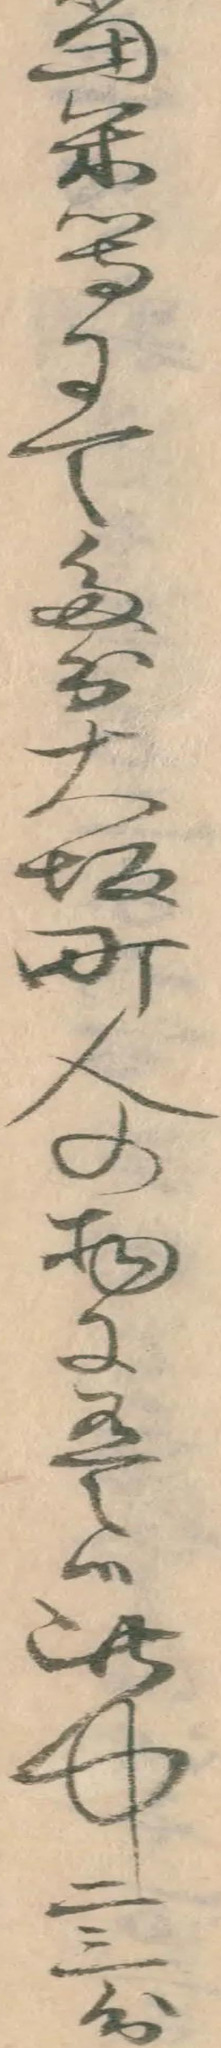当米等にて多分大坂町人の物に有之候此中二三分
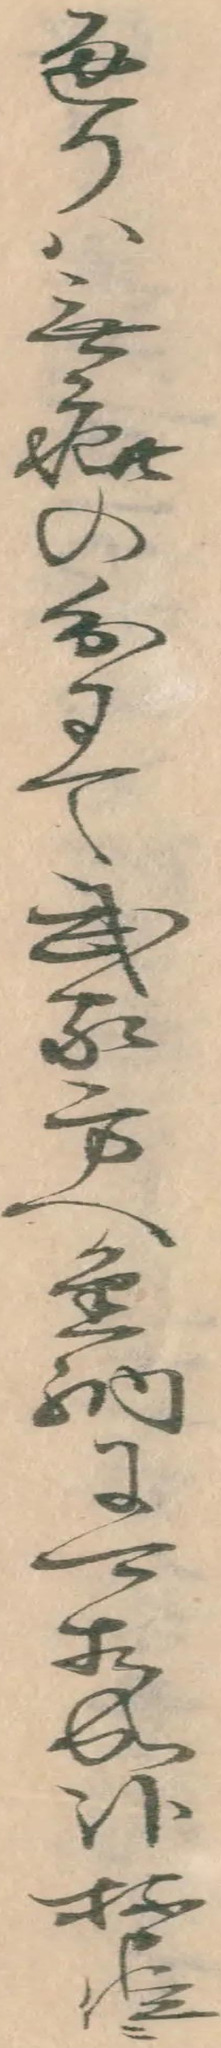通りは無疵の分にて武家方へ金納に可相成哉抔申位に
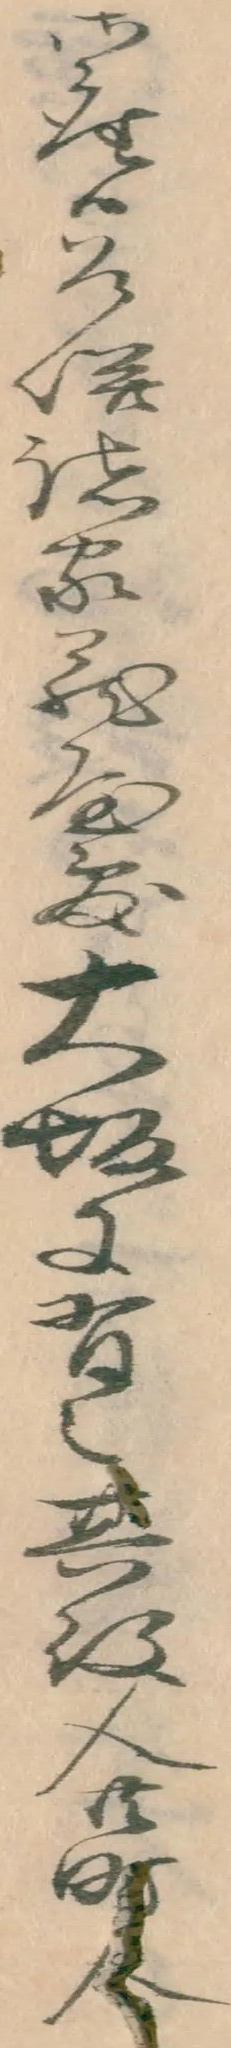御座候乍併諸家蔵屋敷大坂に有之其役人共町人
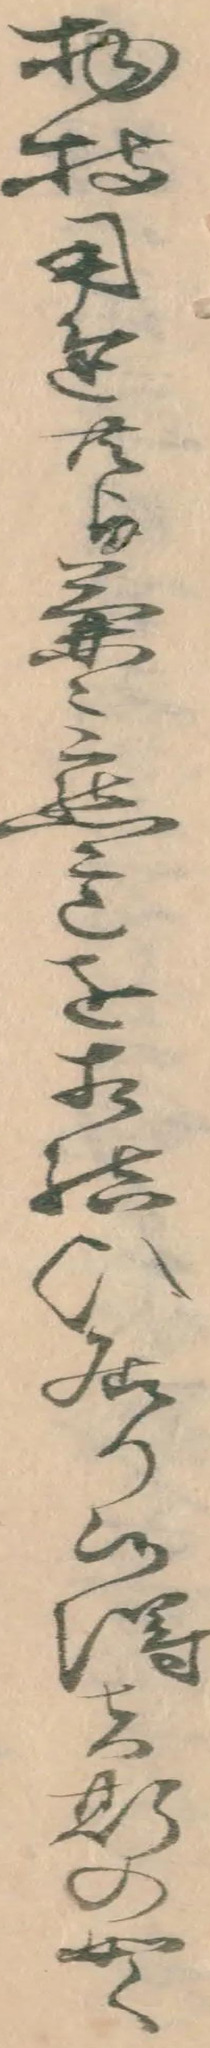物持用達共と兼々懇意を相結ひ居り候得者斯の如く
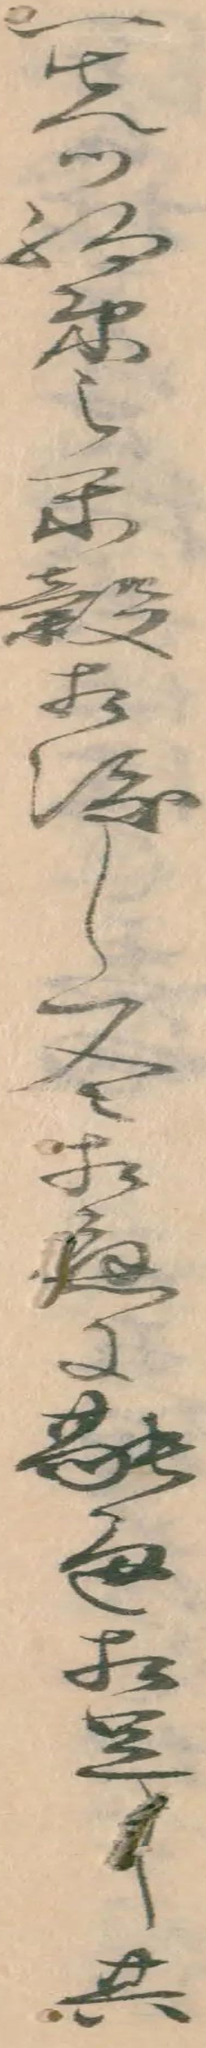一先ツ約束之米穀相渡し又者相応に融通相足し其
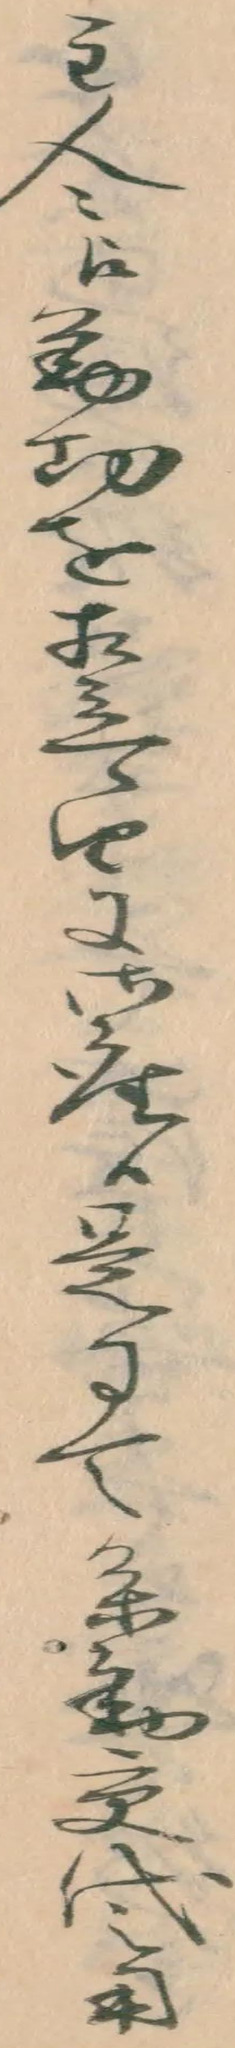主人に被勤功を相立候由に御座候是にて参勤交代之用
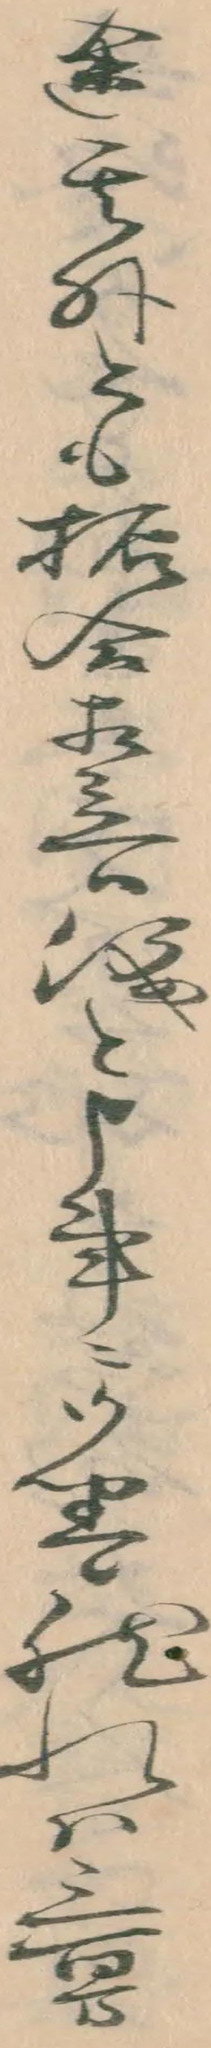途其外とも振合相立候儀と申事に御坐候然れは三百万
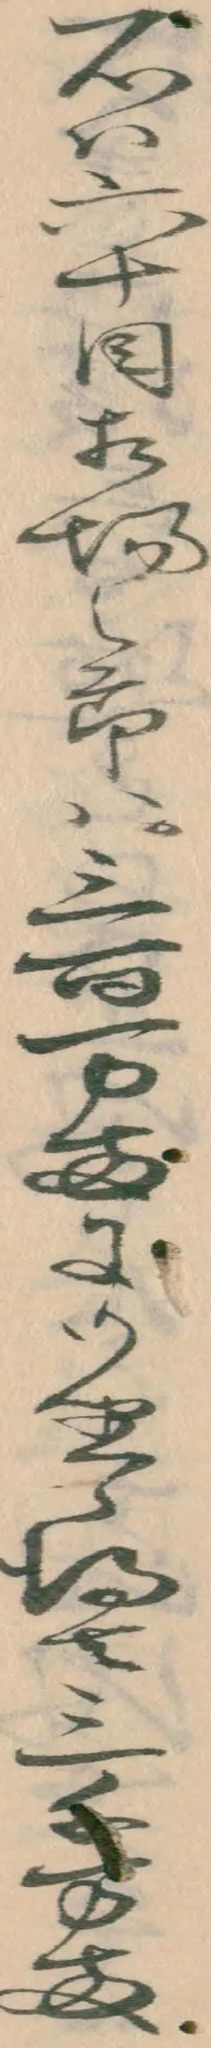石は六十目相場之節は。三百万両に御坐候得者三千万両
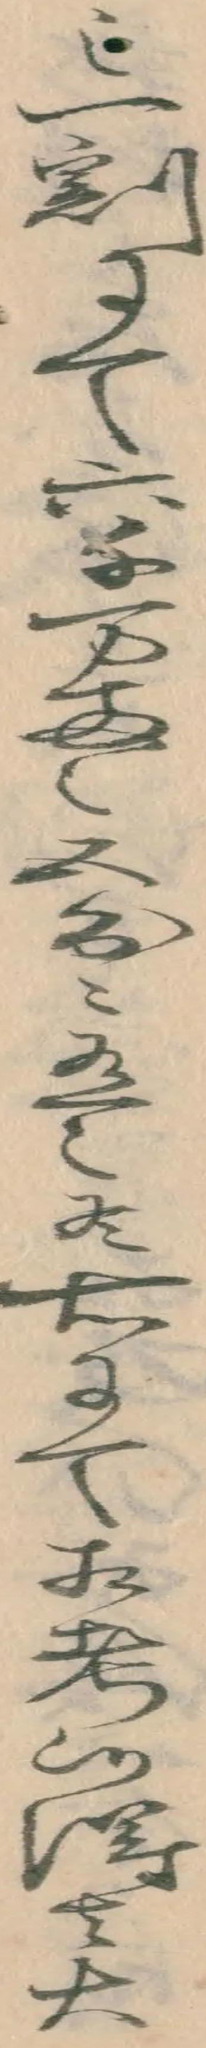之一割にて六千万両之五分に有之共右にて相考候得者大
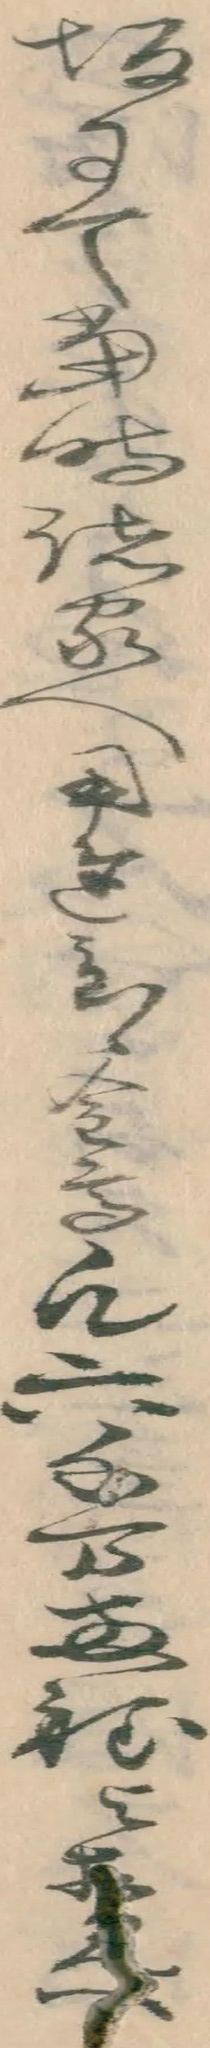坂にて当時諸家へ用達置候金高凡六千万両程と相見へ
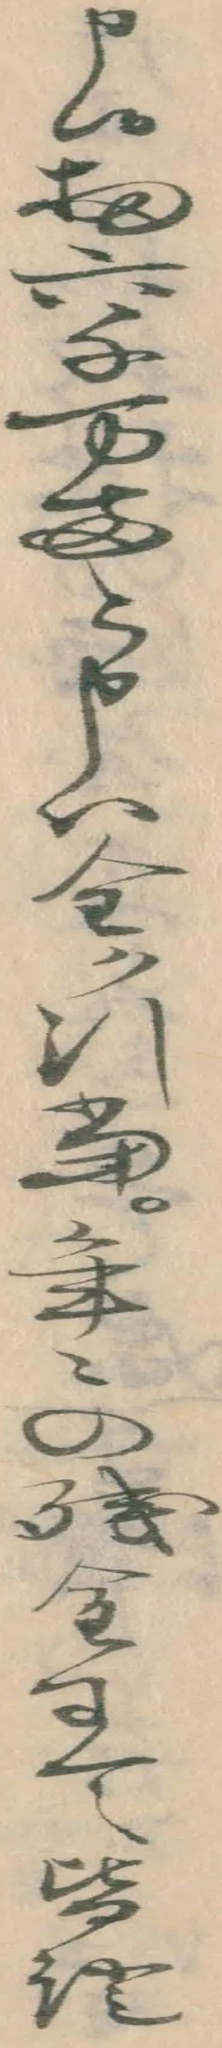申候扨六千万両と申は全く引当。年々の残金にて皆証
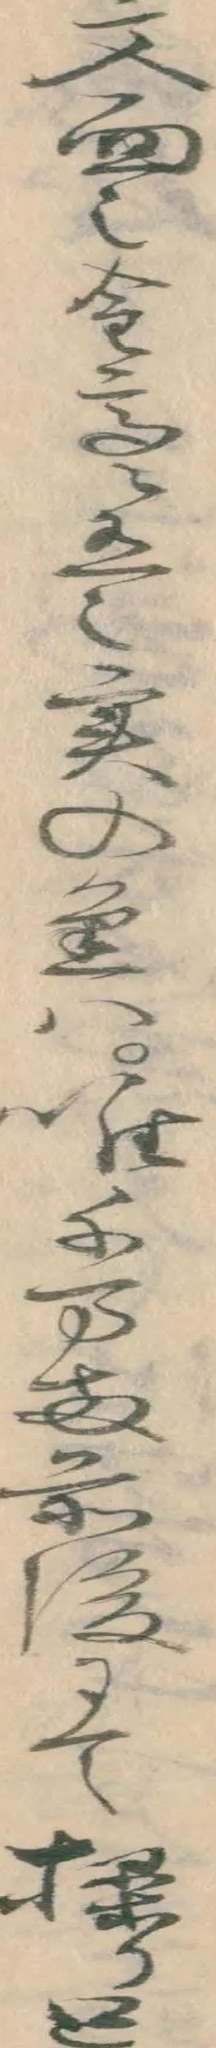文面之金高に有之実の金は。唯千万両前後にて操り廻
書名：斎庭之穂
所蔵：国立国会図書館 National Diet Library, JAPAN
